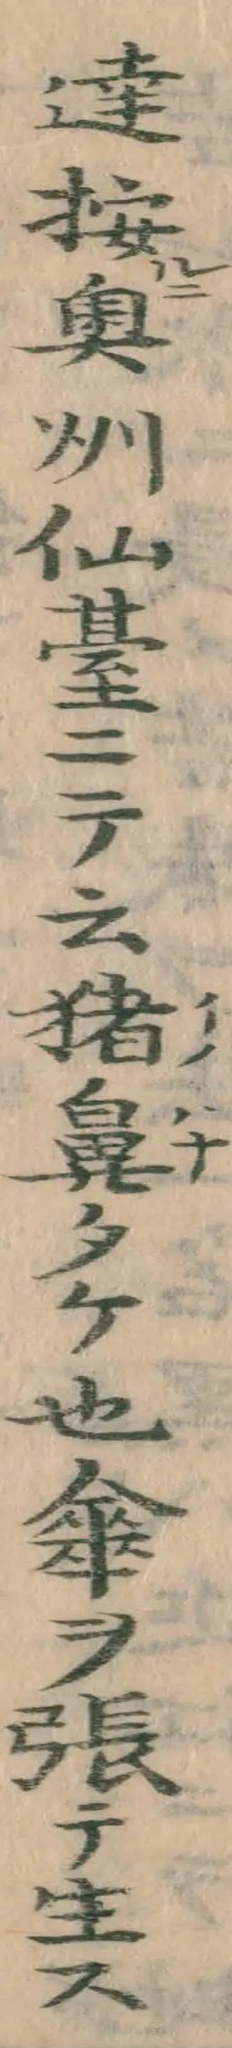達按奥州仙台ニテ云猪鼻タケ也傘ヲ張テ生ス
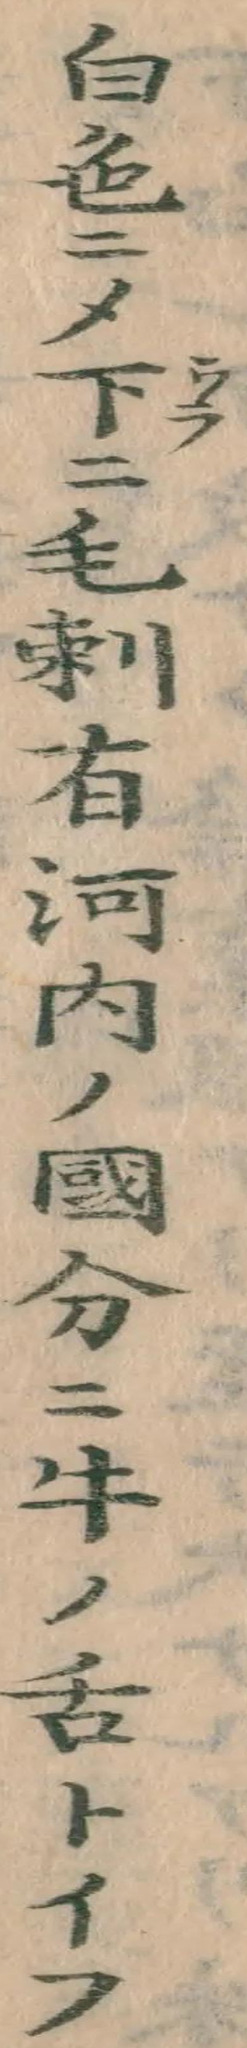白色ニシテ下ニ毛刺有河内ノ国分ニ牛ノ舌トイフ
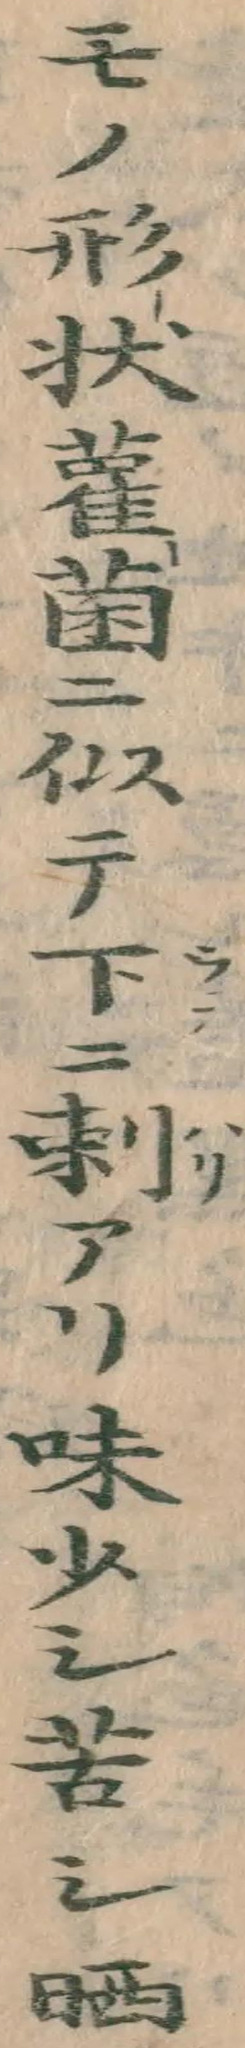モノ形状雚菌ニ似テ下ニ刺アリ味少シ苦シ晒
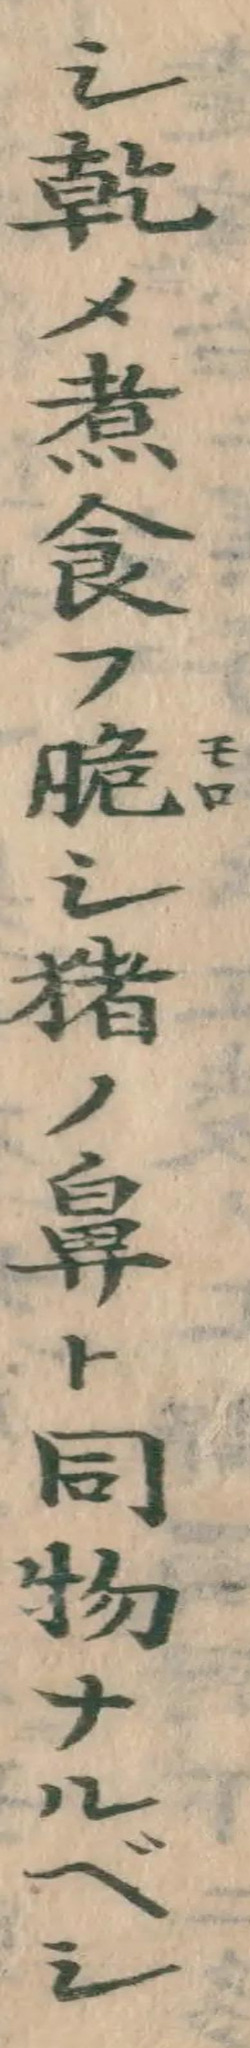シ乾シテ煮食フ脆シ猪ノ鼻ト同物ナルベシ

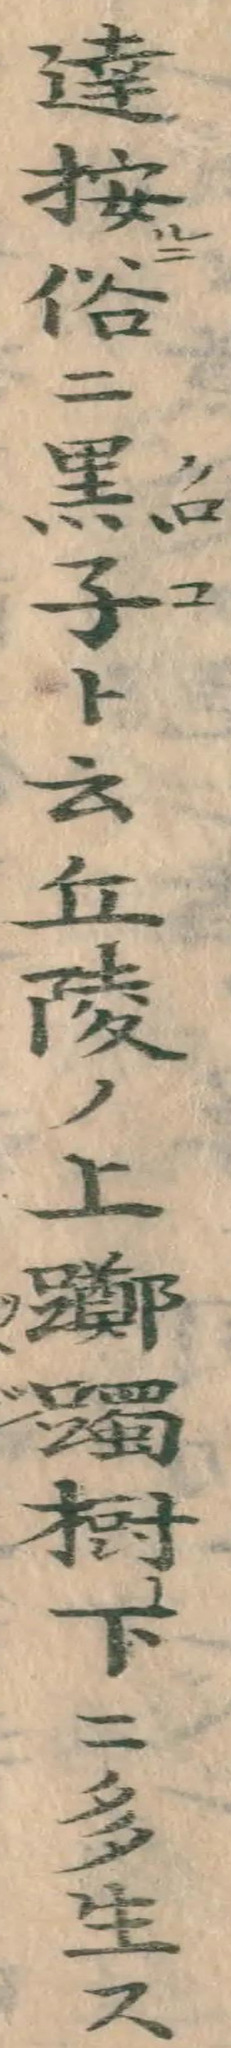達按黒子ト云丘陵ノ上躑躅樹下ニ多生ス
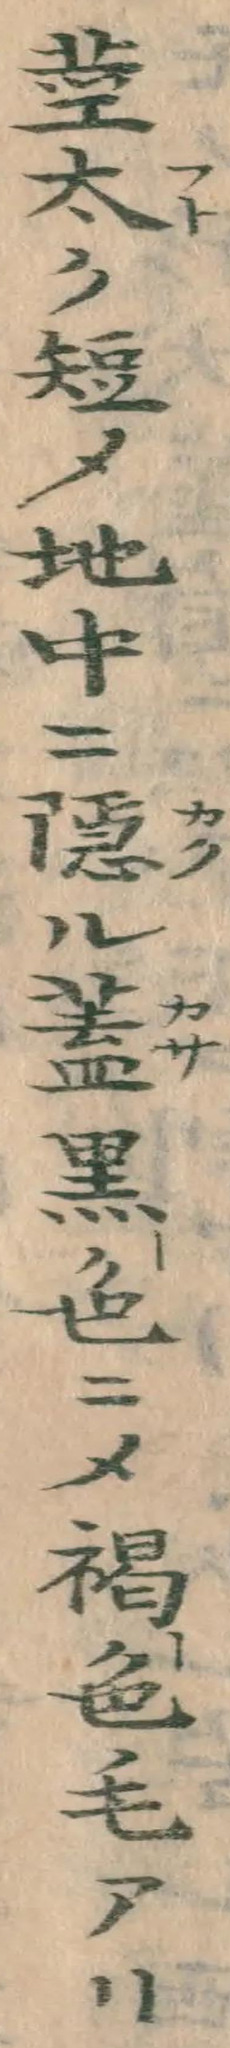茎太ク短シテ地中ニ隠ル葢黒色ニシテ褐色毛アリ
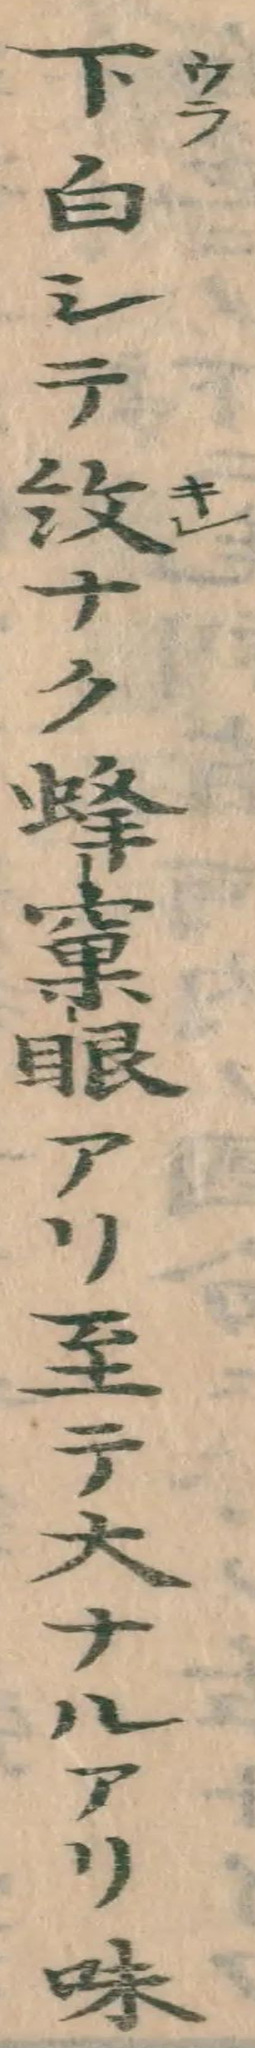下白シテ紋ナク蜂窠眼アリ至テ大ナルアリ味
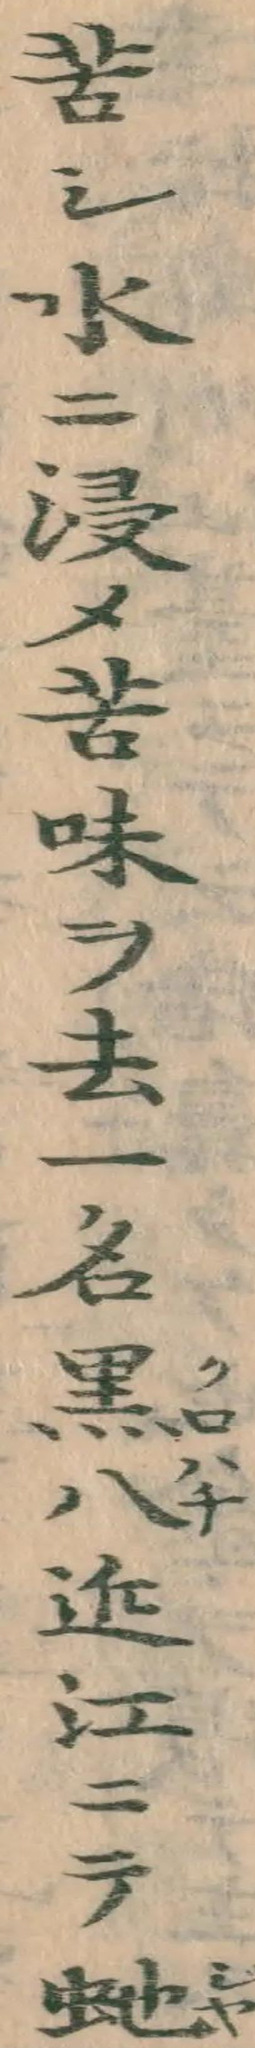苦シ水ニ浸シテ苦味ヲ去一名黒八近江ニテ虵
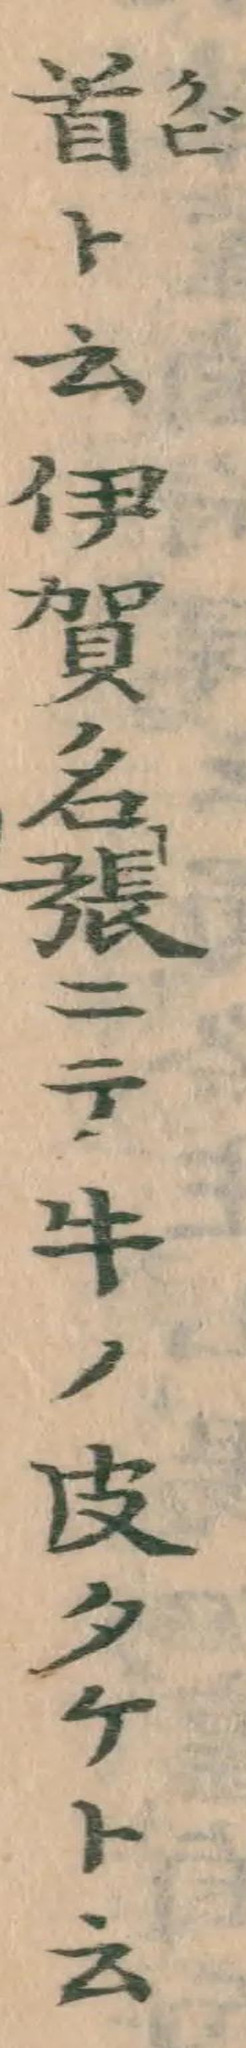首ト云伊賀名張ニテ牛ノ皮タケト云
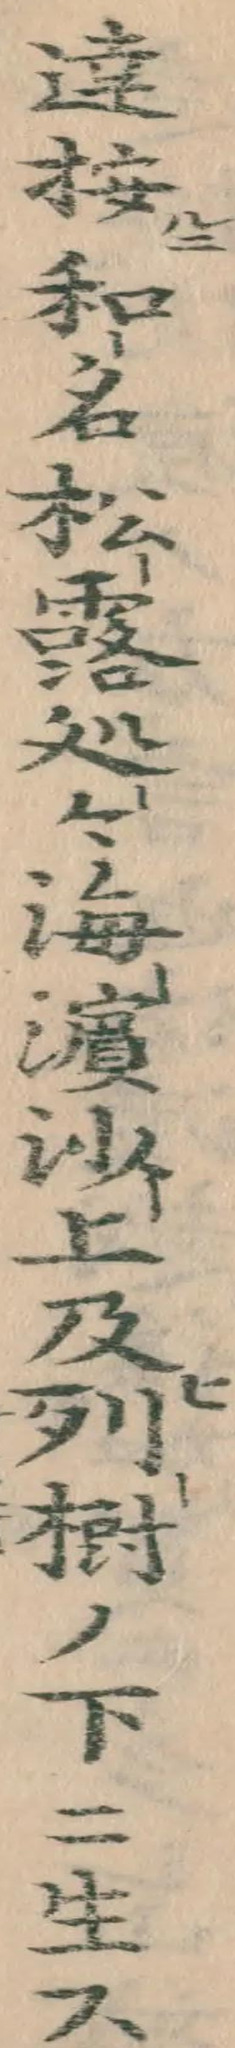達按和名松露処々海浜沙上及列樹ノ下ニ生ス
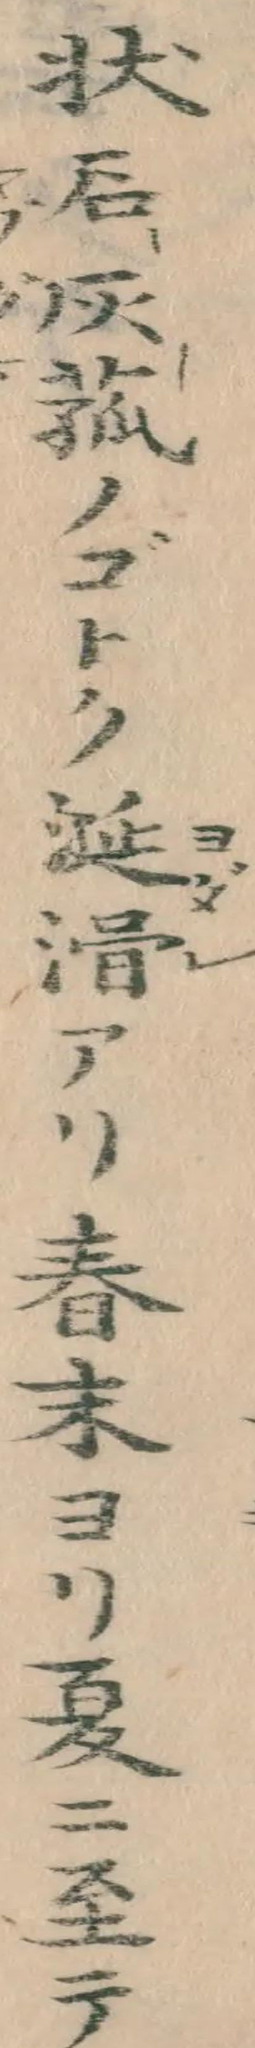状石灰菰ノゴトク涎滑アリ春末ヨリ夏ニ至テ
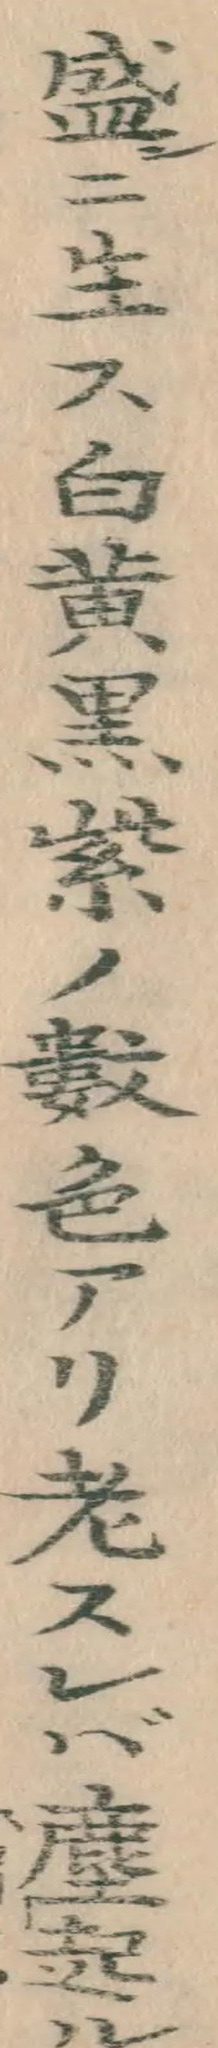盛ニ生ス白黄黒紫ノ数色アリ老スレバ塵起ル
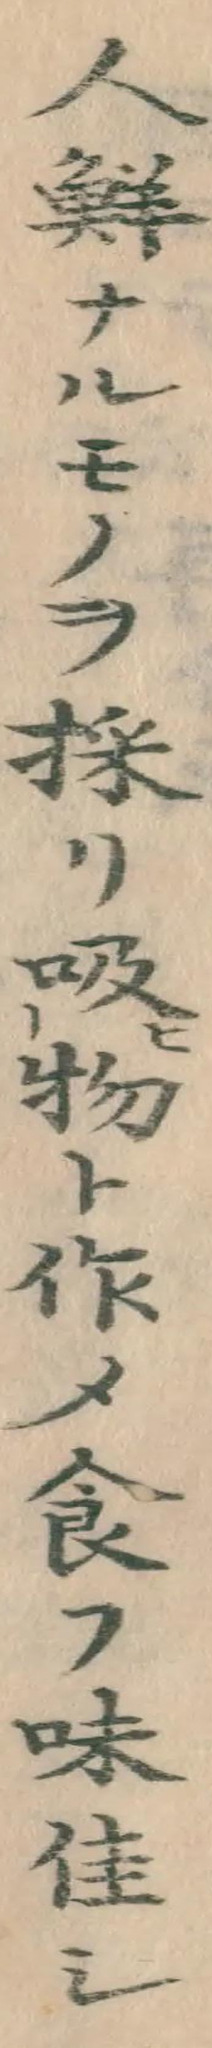人鮮ナルモノヲ採リ吸物ト作シテ食フ味佳シ
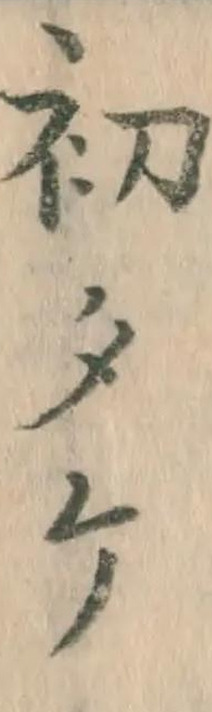初タケ
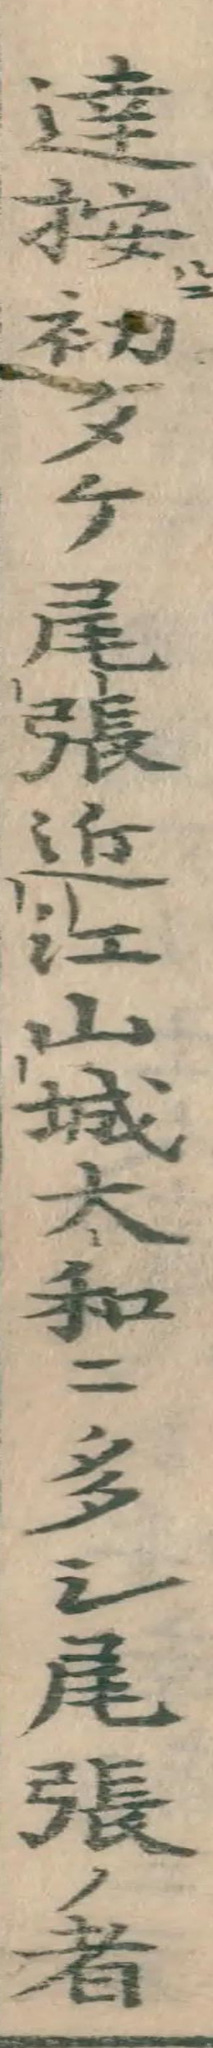達按初タケ尾張近江山城大和ニ多シ尾張ノ者

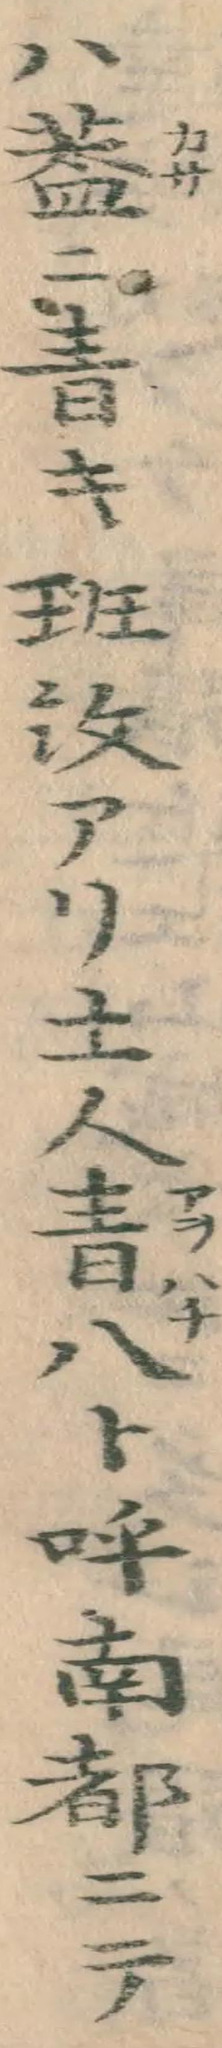ハ葢ニ青キ班紋アリ土人青八ト呼南都ニテ
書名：怡顔斎菌品 2巻
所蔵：国立国会図書館 National Diet Library, JAPAN
